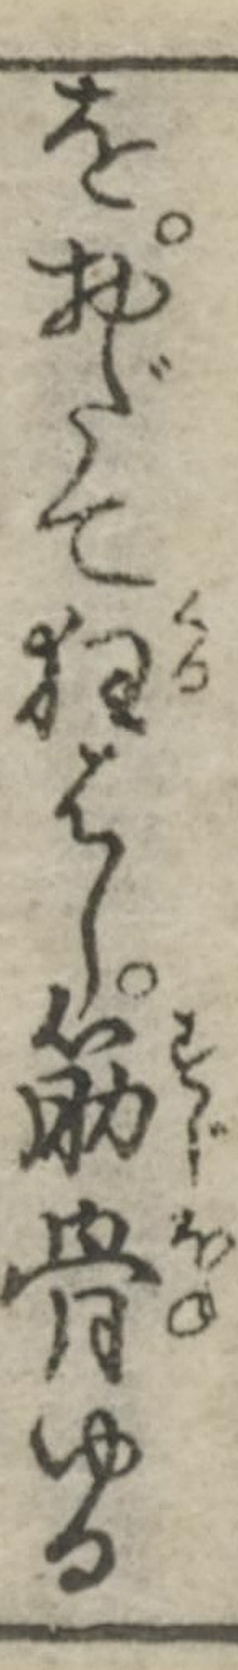を。おだて狂はし。筋骨ゆる
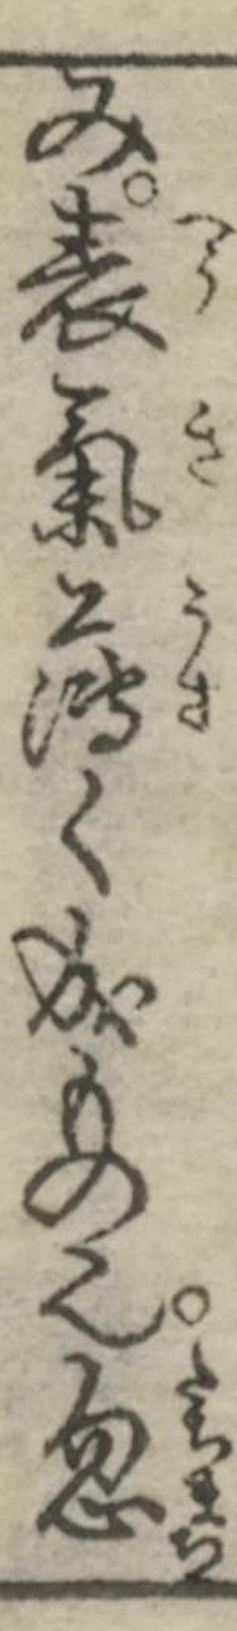み。表気薄く成もの也。忽
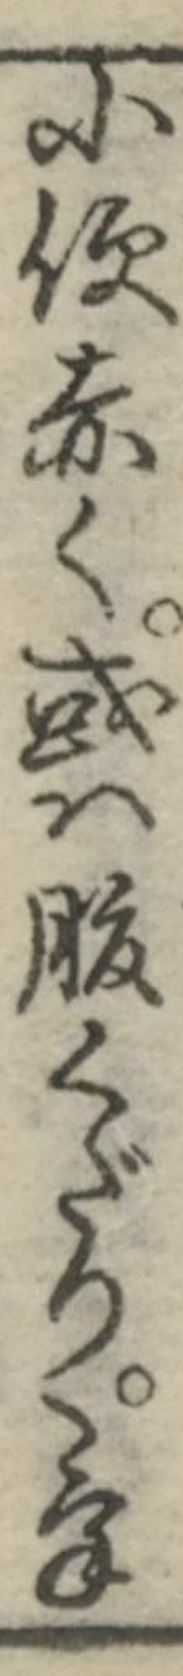小便赤く。或は腹くだり。気
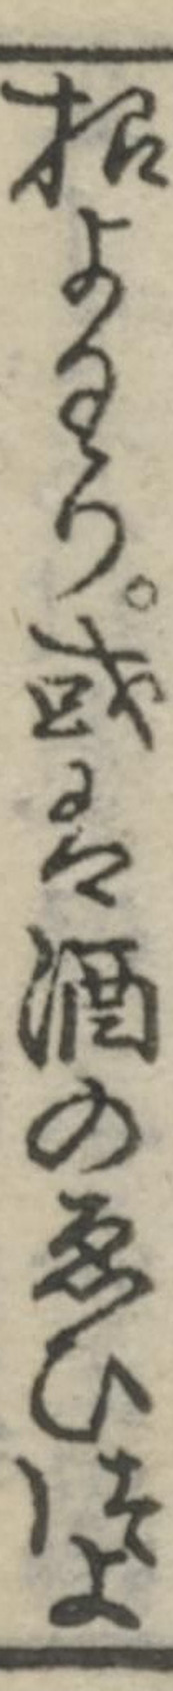根よわり。或は酒のゑひつよ
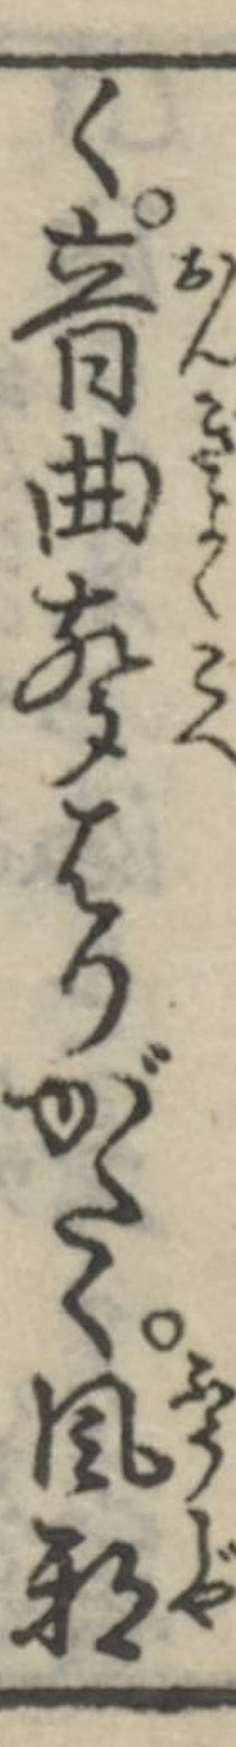く。音曲声はりがたく。風邪
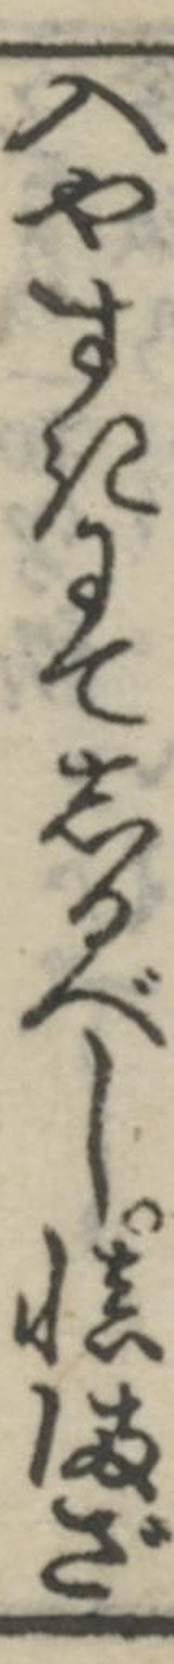入りやすきにてしるべし。慎まざ
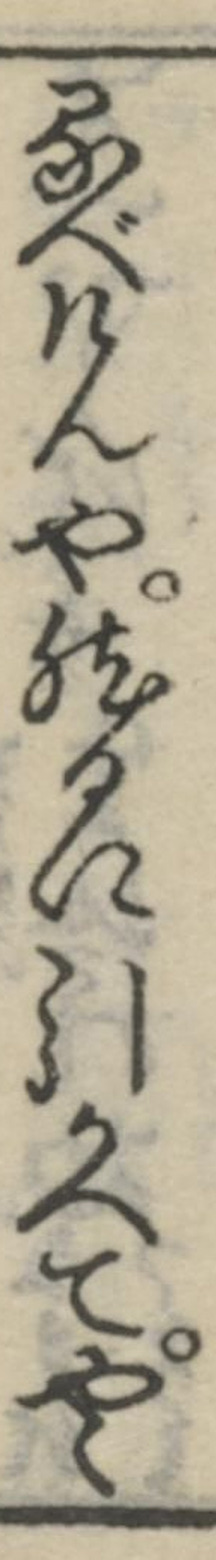るべけんや。然るに引かへて。やゝ
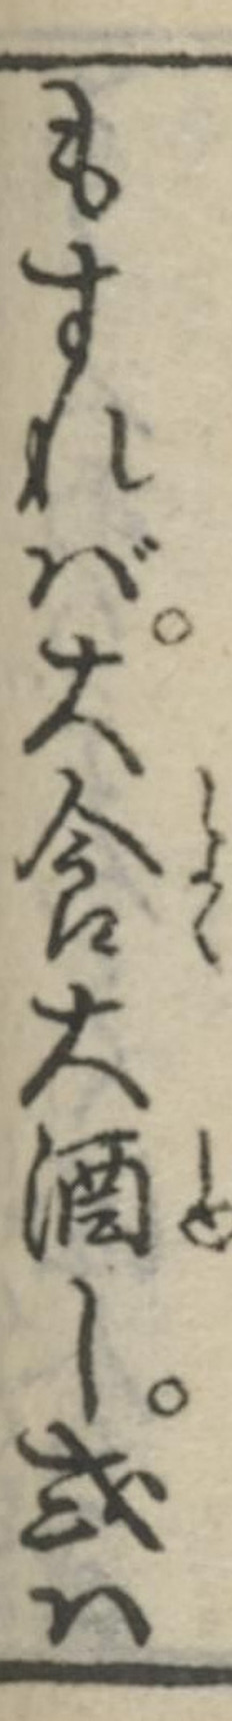もすれば。大食大酒し。或は
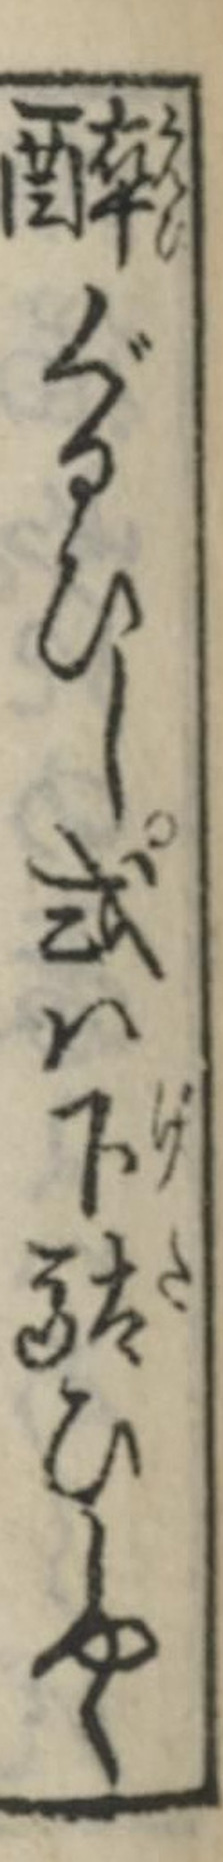酔ぐるひし。或は下駄ひしやく
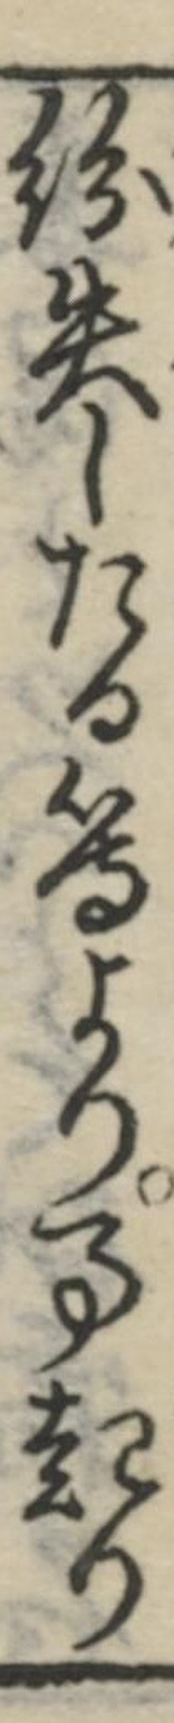紛失したる等より。事起り
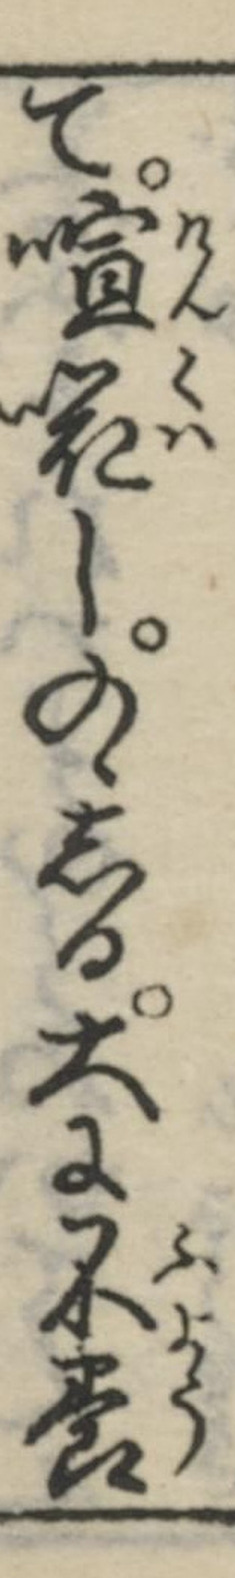て。喧嘩し。のゝしる。大に不養
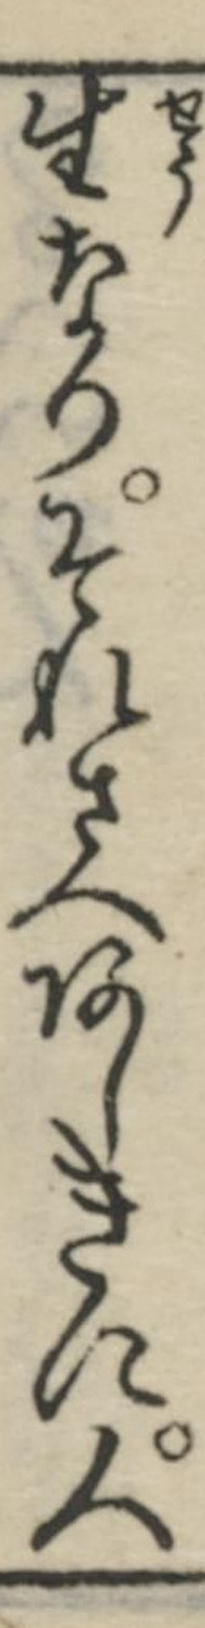生なり。それさへあしきに。人
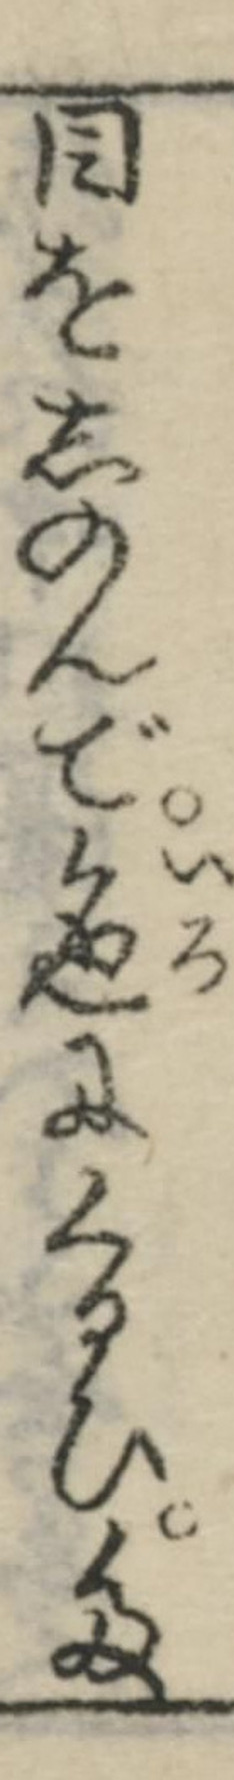目をしのんで。色にくるひ。た
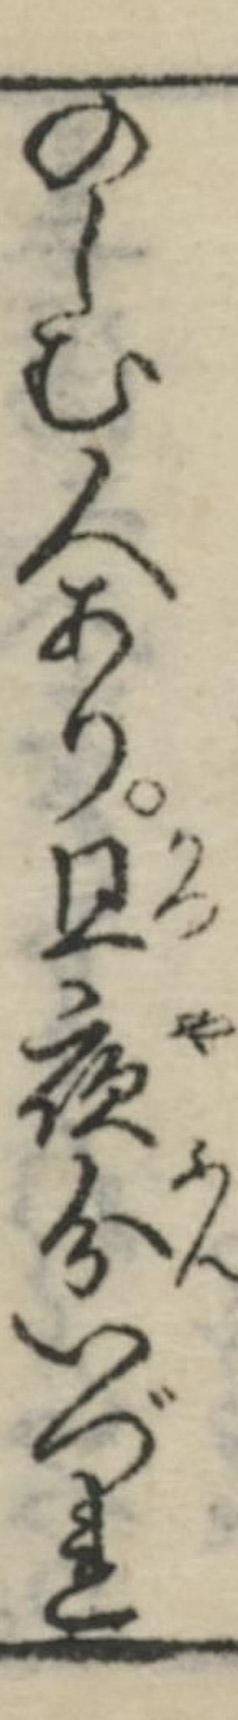のしむ人あり。且夜分いづれ
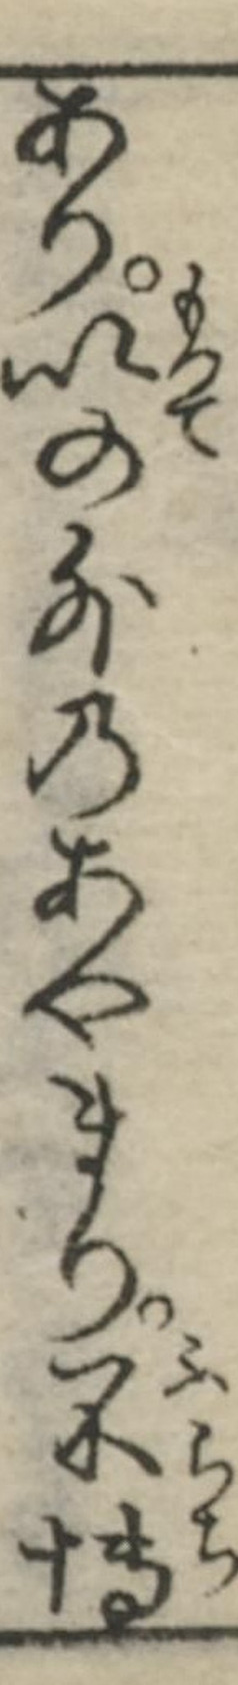あり。以の外のあやまり。不埒
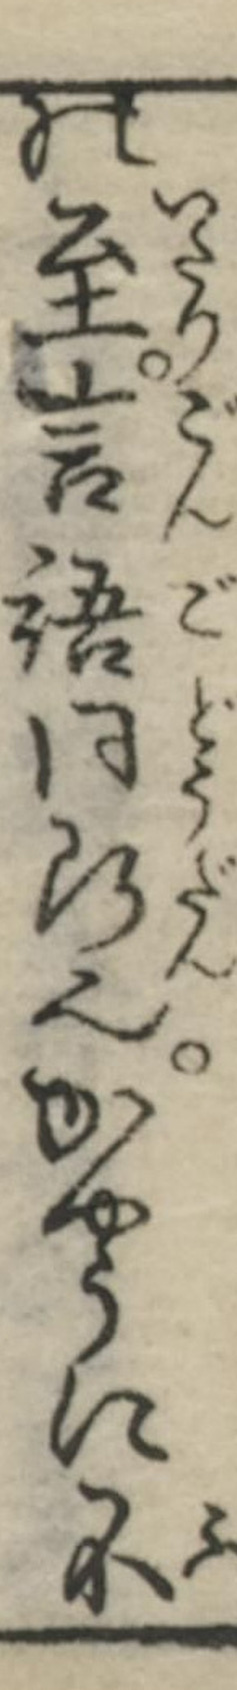の至。言語同断也。かやうに不
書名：但州城崎浴湯辧
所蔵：東京大学地震研究所図書室 Earthquake Research Institute Library, The University of Tokyo, JAPAN
